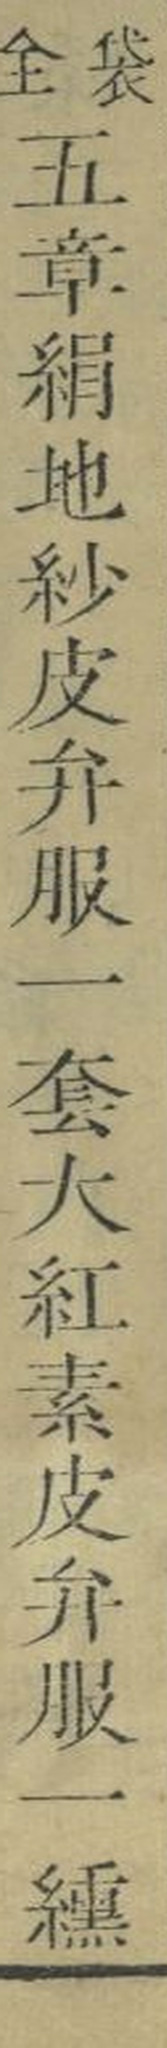袋全五章絹地紗皮弁服一套大紅素皮弁服一纁

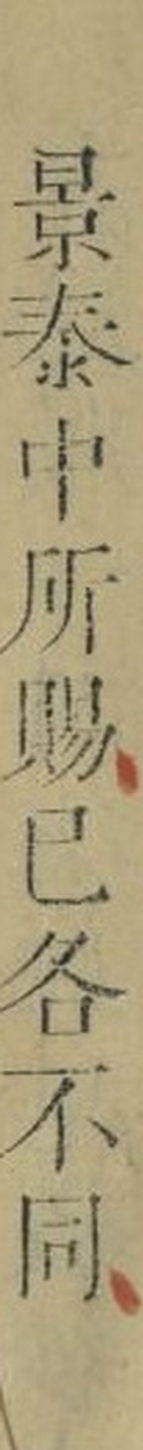景泰中所賜巳各不同
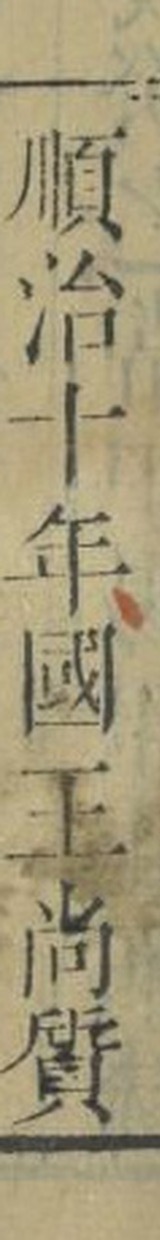順治十年國王尚質
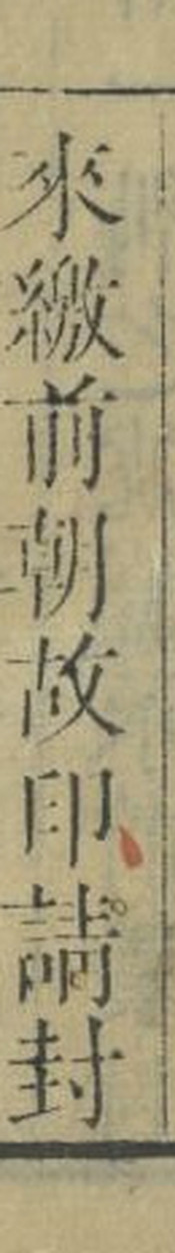來繳前朝故印請封
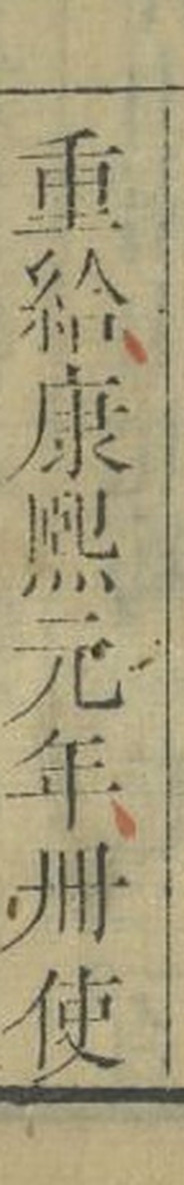重給康煕元年册使
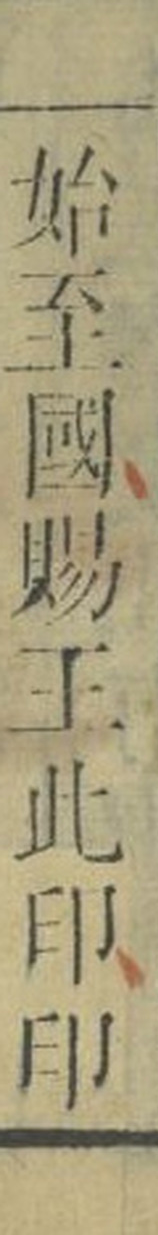始至國賜王此印印
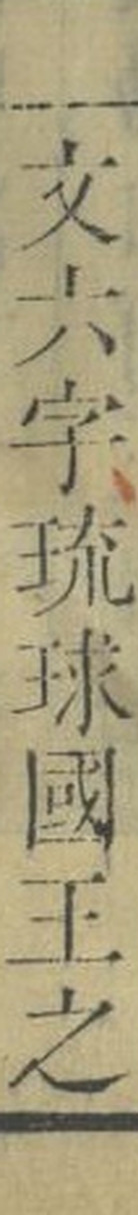文六字琉球國王之
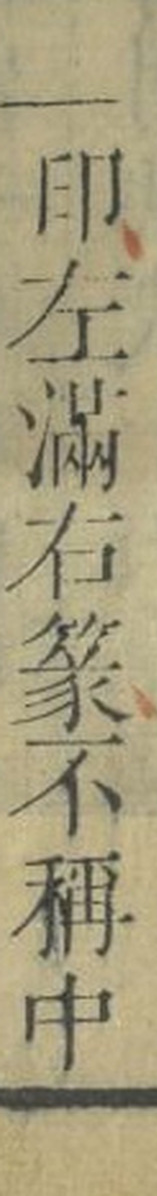印左滿右篆不稱中

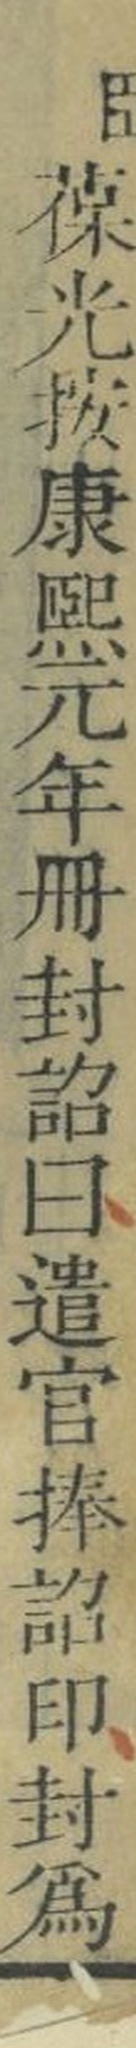臣葆光按康煕元年冊封詔曰遣官捧詔印封爲
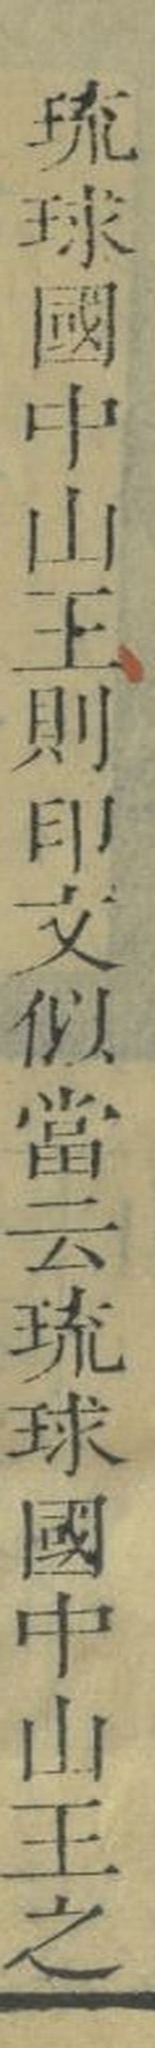琉球國中山王則印文似當云琉球國中山王之
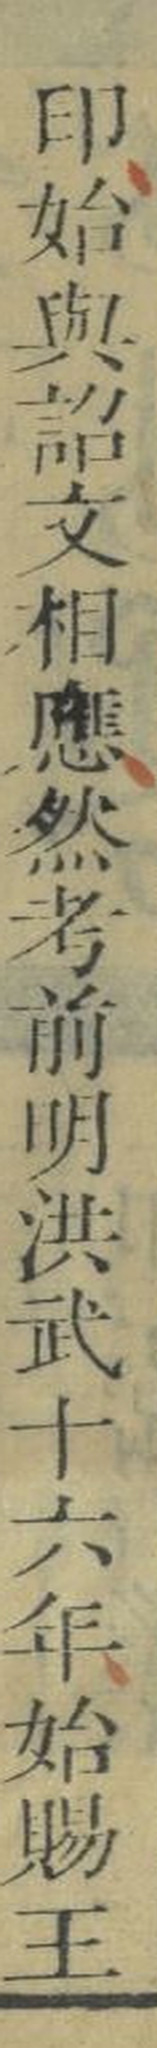印始與詔文相應然考前明洪武十六年始賜王
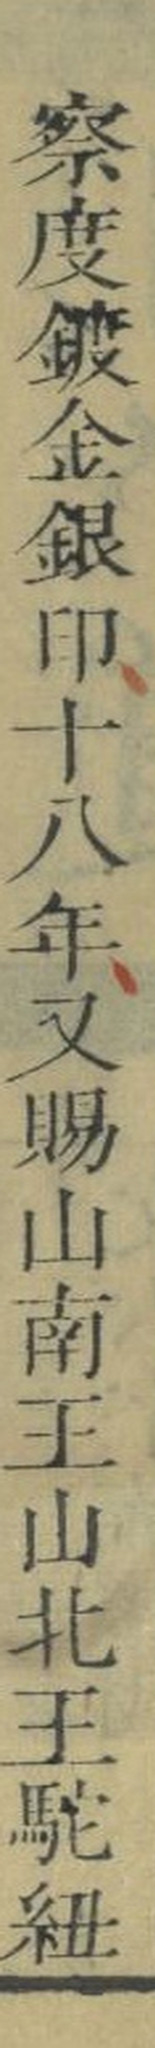察度鍍金銀印十八年又賜山南王山北王駝紐
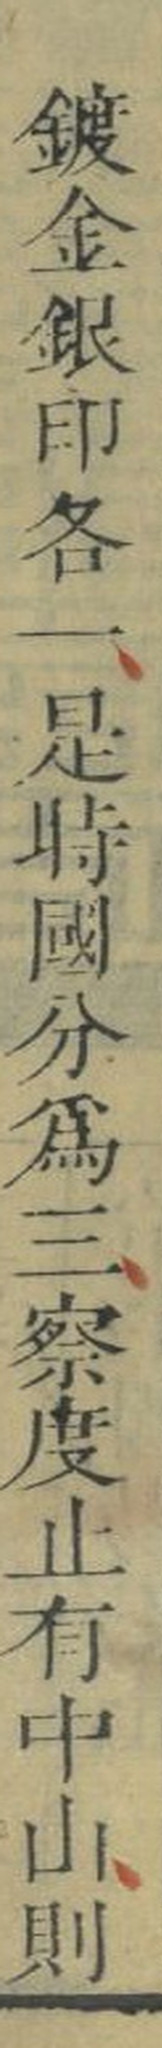鍍金銀印各一是時國分爲三察度止有中山則
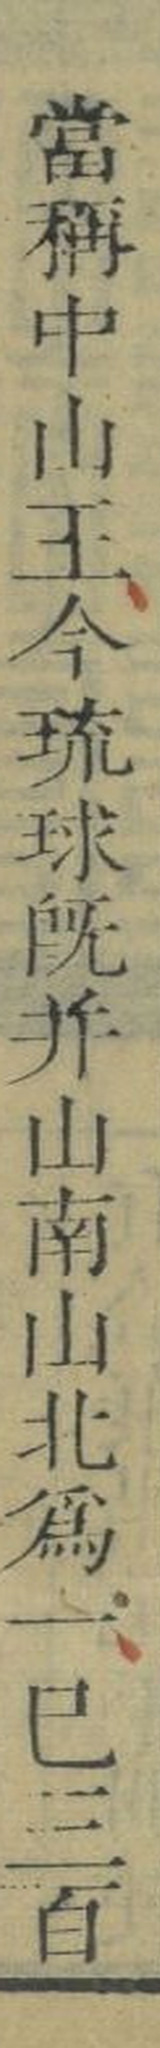當稱中山王今琉球既并山南山北爲一巳三百
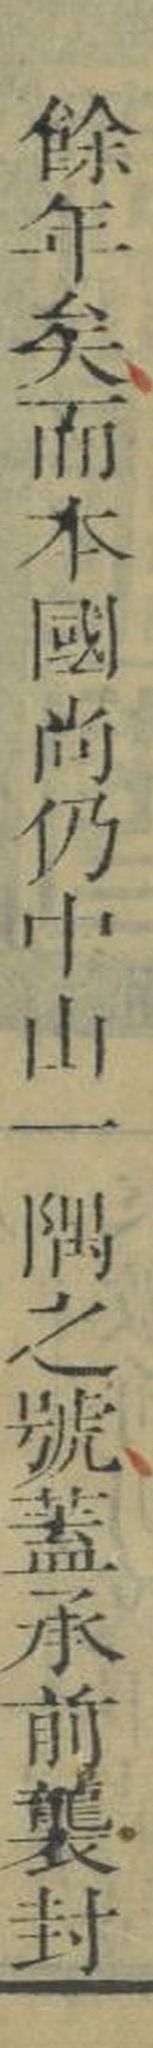餘年矣而本國尚仍中山一隅之號蓋承前襲封
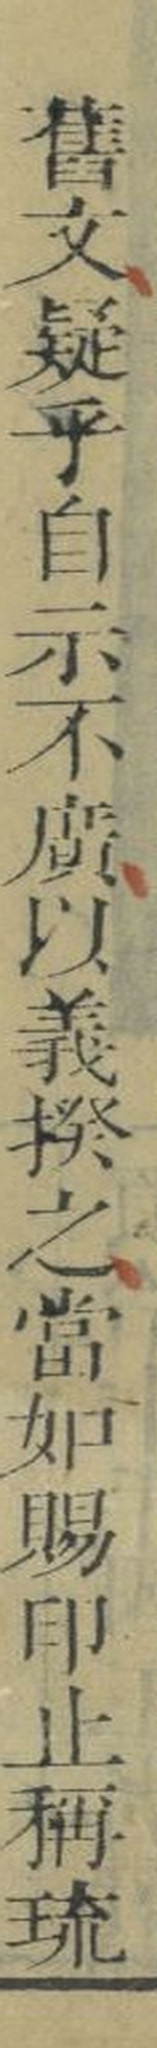舊文疑乎自示不廣以義揆之當如賜印止稱琉
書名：中山伝信録 巻一、巻二
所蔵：University of the Ryukyus Library
